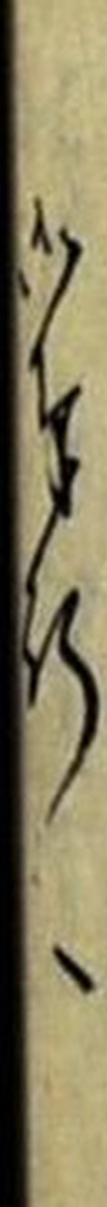御奉行へ
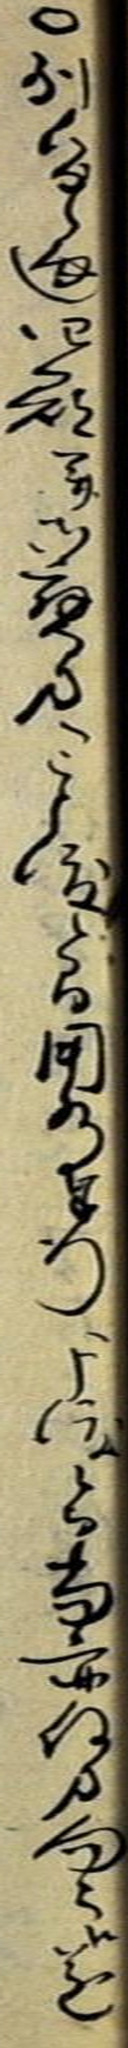〇別紙之通四郡并御鷹方へ被申渡候間用水奉行へ申渡候而尚亦役方向々江遂
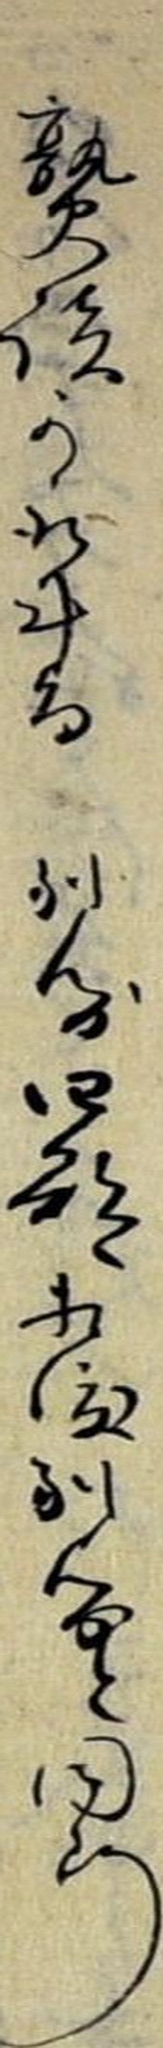熟談可取計旨別紙四郡へ相渡別紙と同断
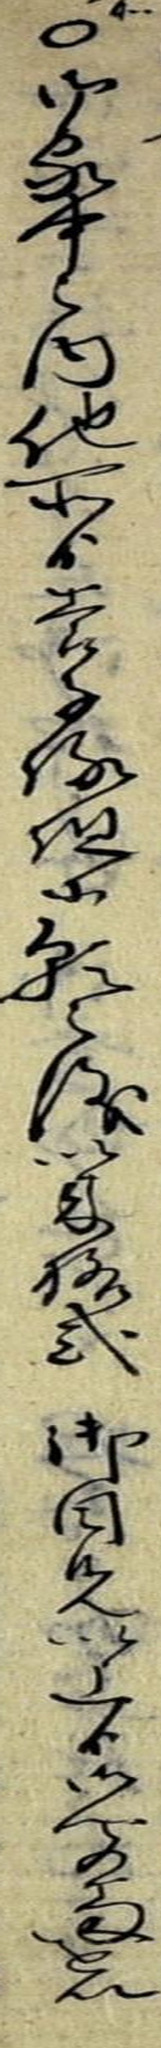〇御家中之内他所ゟ養子縁組等願之儀以来格式御目見以上ゟ御聞番を以
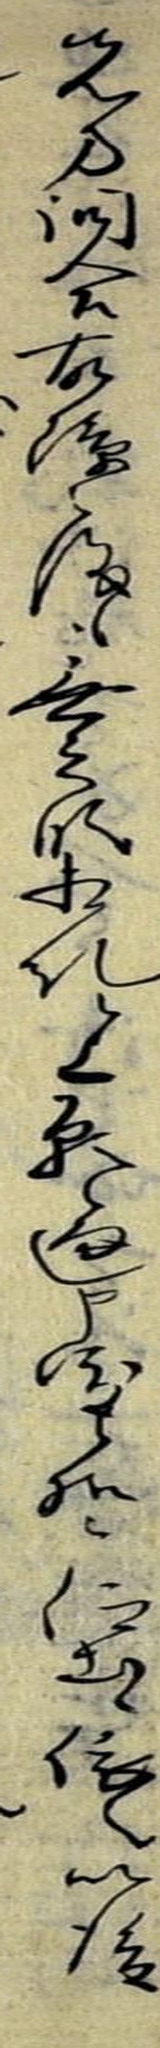先方問合故障之儀も無之段相糺候上願之通申渡候様被仰出候依之以後
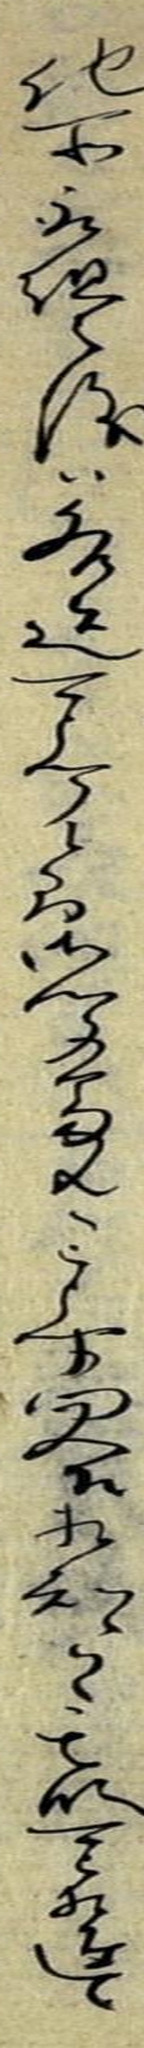他所取組之儀ハ各迄可申聞候間御聞番共へ被申聞問合相知候ハヽ其段可被相達候
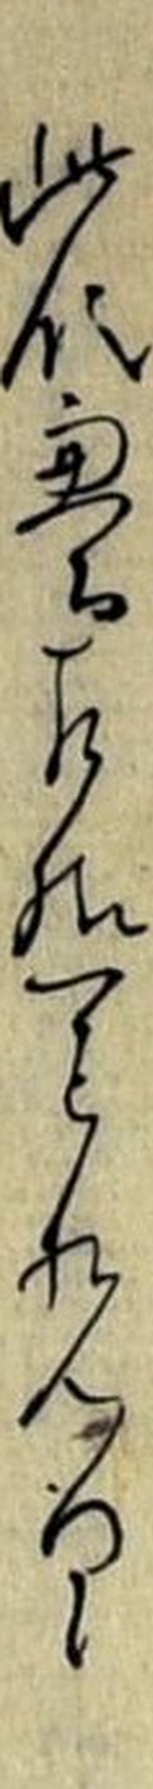此段兼而左様可被相心得候
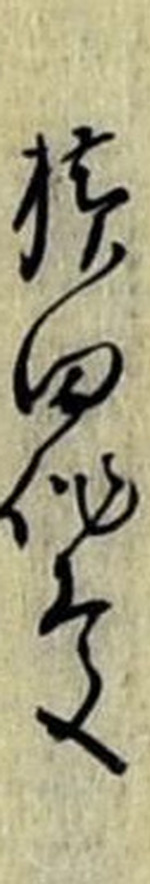横田作太夫
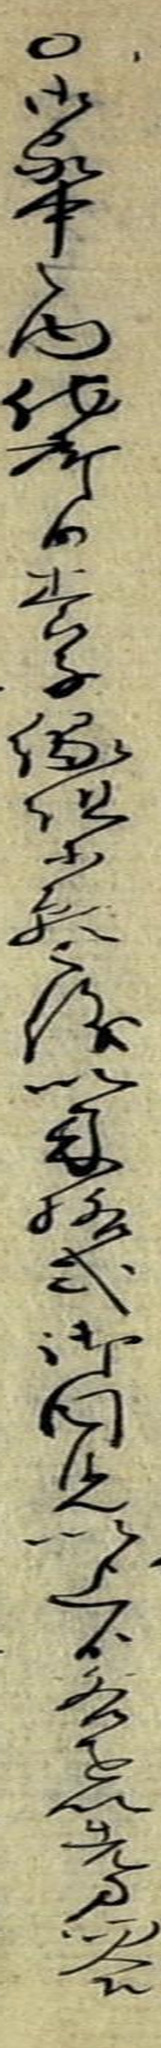〇御家中之内他所ゟ養子縁組等願之儀以来格式御目見以上ゟ各を以先方問合
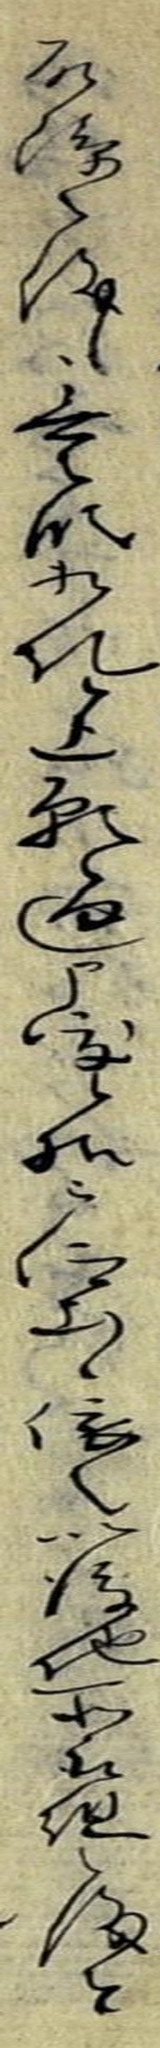故障之儀も無之段相糺候上願之通申渡候様被仰出候依之以後他所取組之儀と
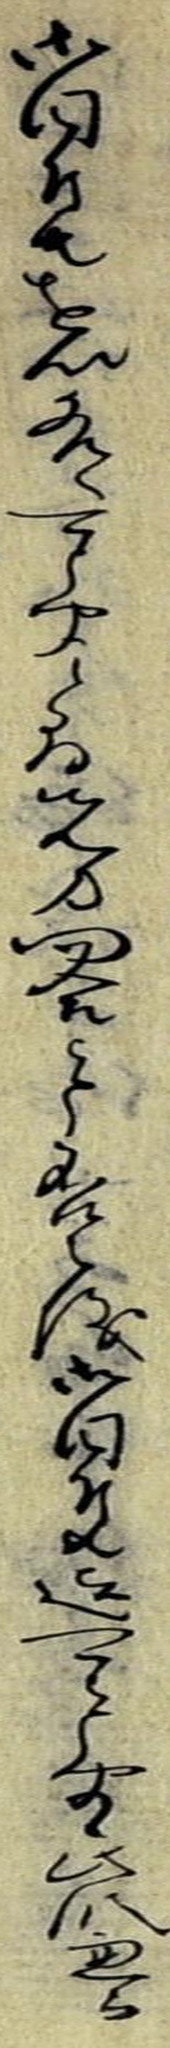御目付共を以各へ可申聞候間先方問合被申否之儀御目付共迄可被申聞候此段兼而
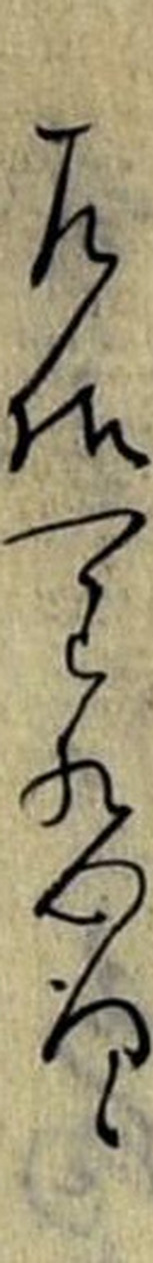左様可被相心得候
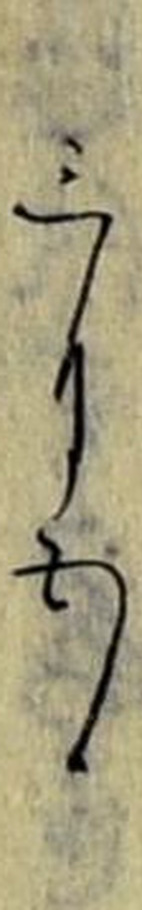三月五日

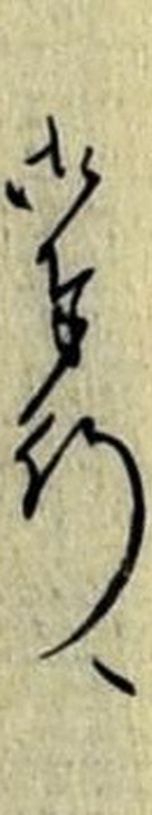御奉行へ
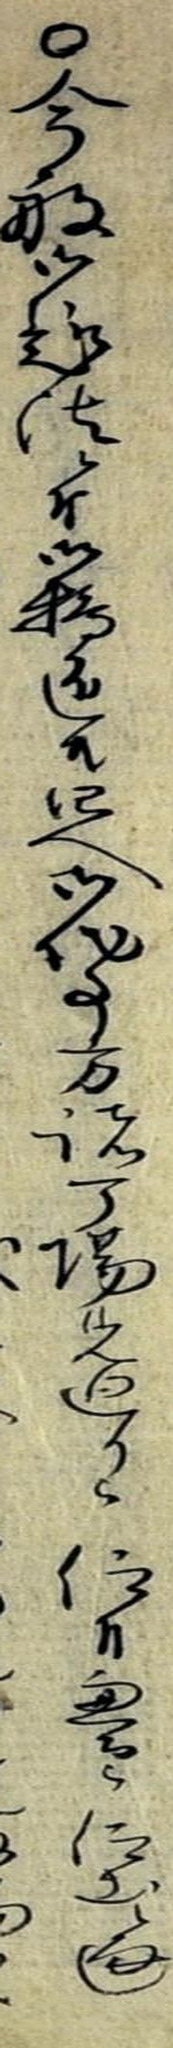〇今般御趣法ニ付御鵜匠共四人御作事方諸丁場見廻り被仰付兼而被仰出候通
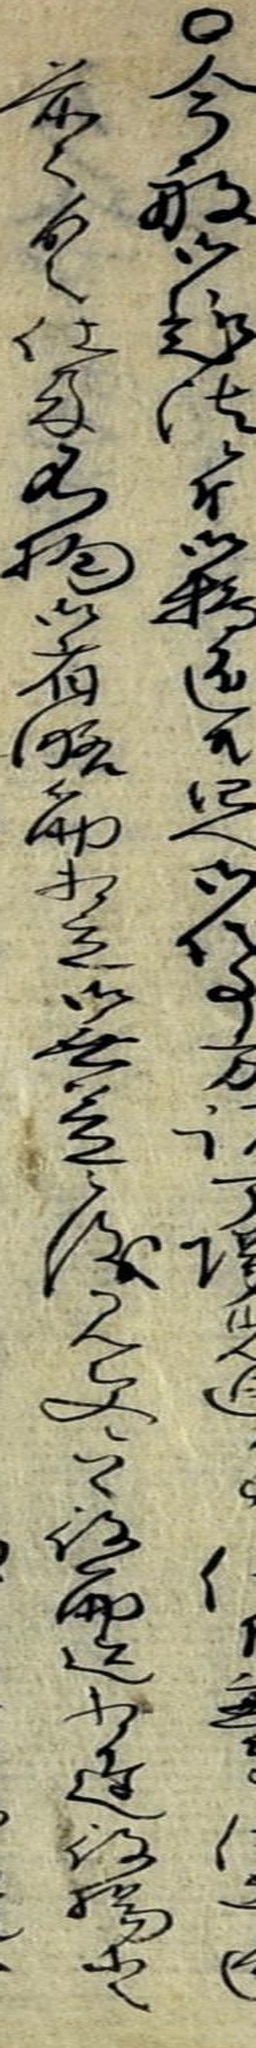前々ゟ之仕来不拘御省略筋相立御無益之儀見受候ハヽ役筋迄相達役場等之
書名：命令之部 三
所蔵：福井県文書館 Fukui Prefectural Archives
